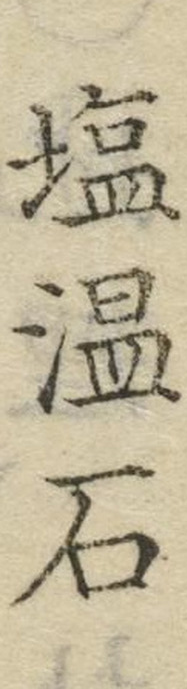塩温石
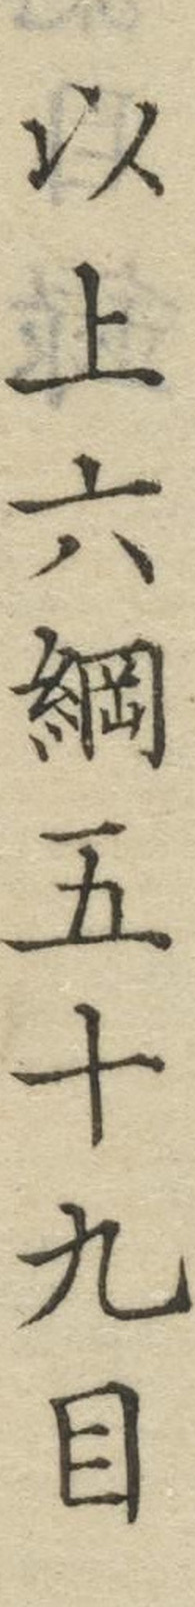以上六綱五十九目
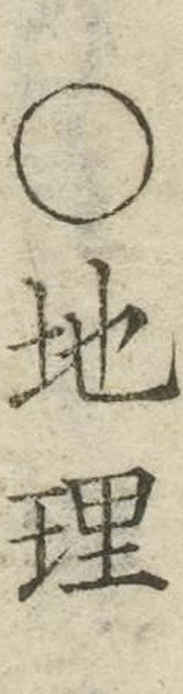○地理
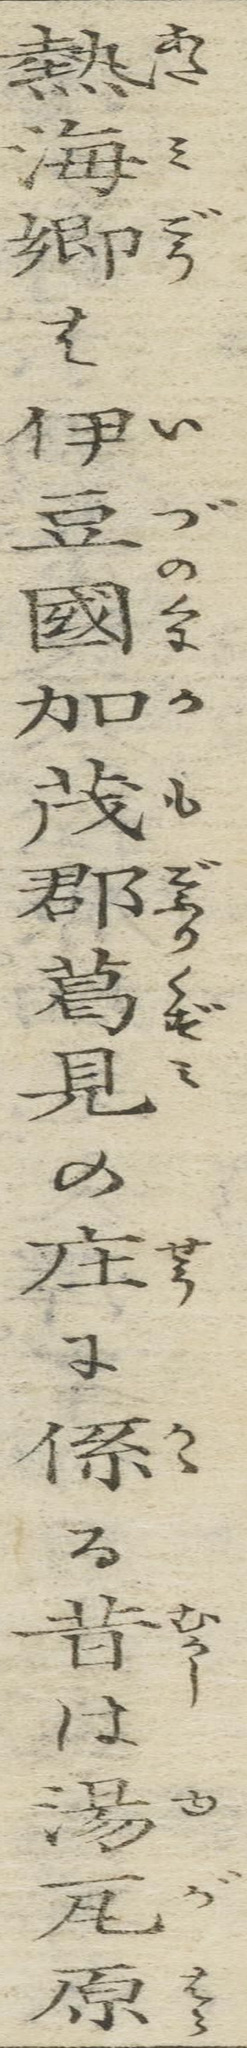熱海郷は伊豆国加茂郡葛見の庄に係る昔は湯瓦原
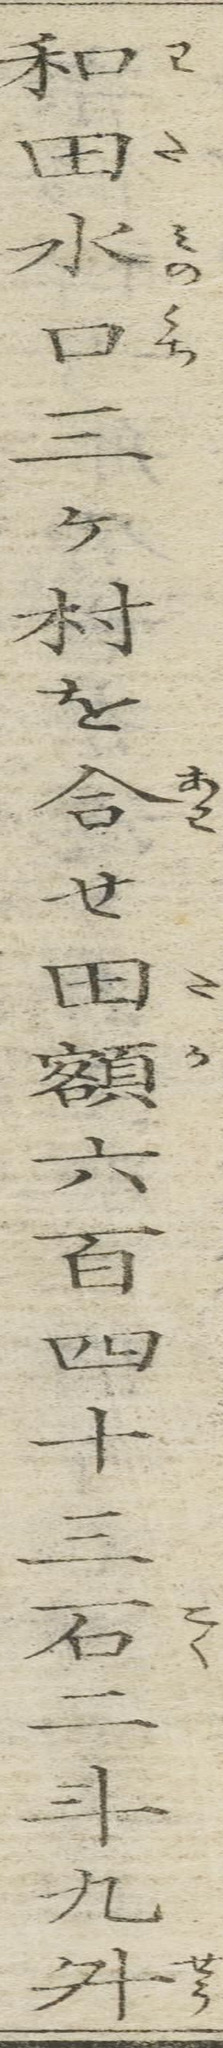和田水口三ヶ村を合せ田額六百四十三石二斗九升
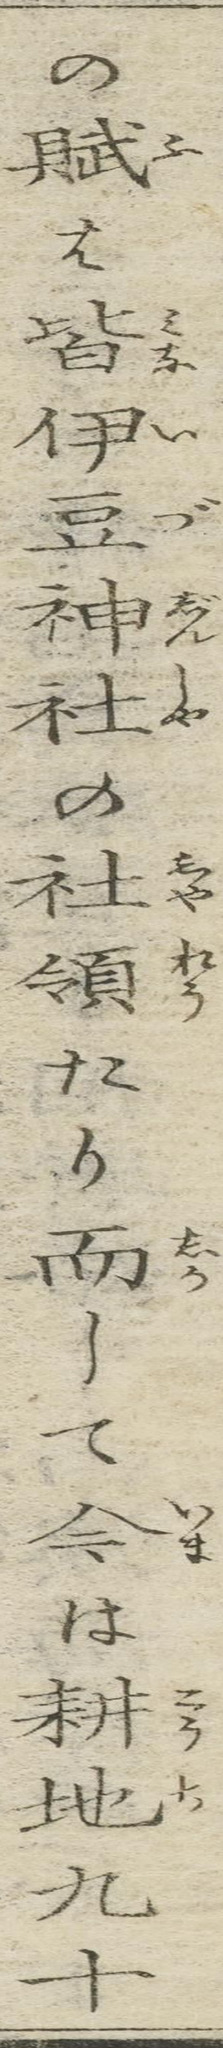の賦は皆伊豆神社の社領たり而して今は耕地九十
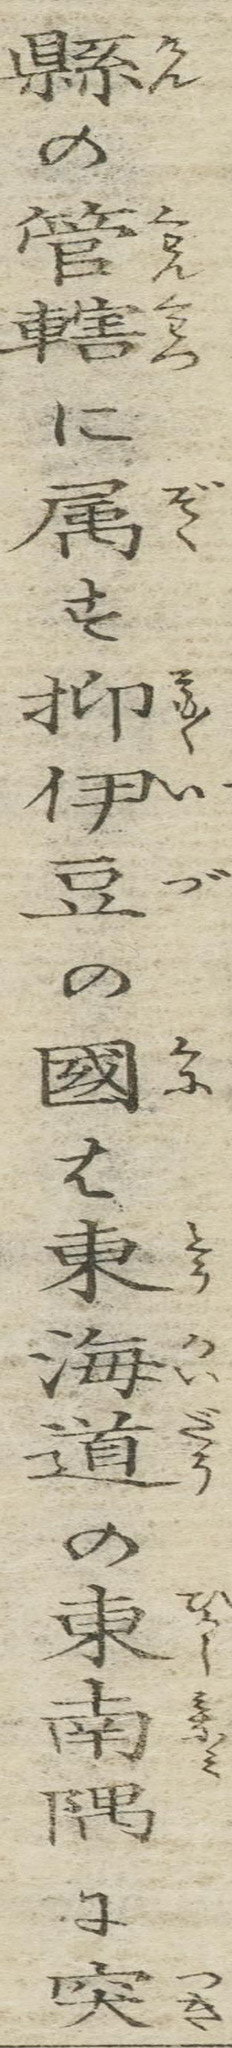県の管轄に属す抑伊豆の国は東海道の東南隅に突
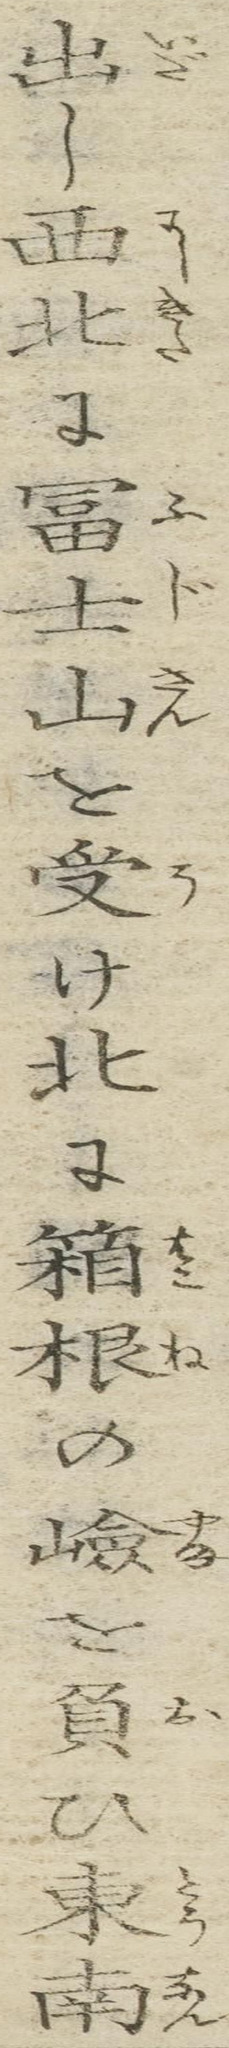出し西北に富士山を受け北に箱根の嶮を負ひ東南

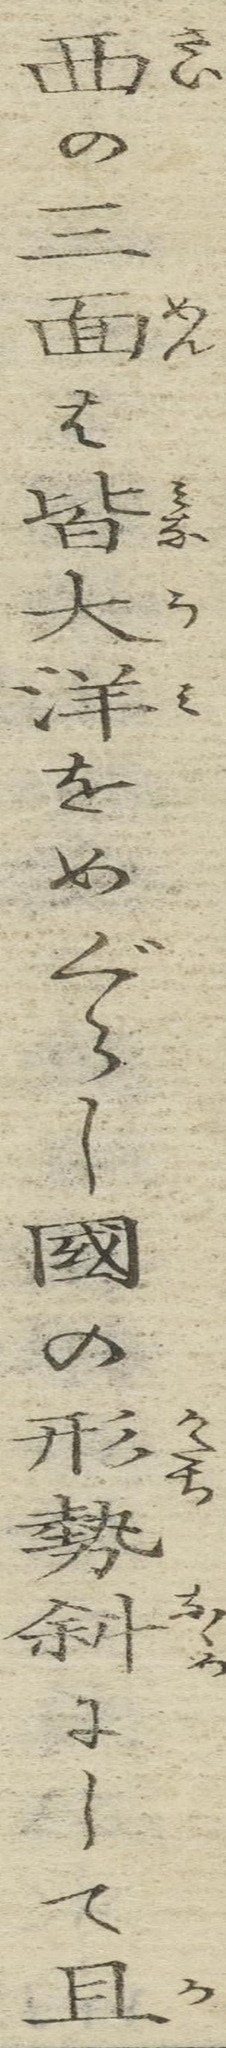西の三面は皆大洋をめぐらし国の形勢斜にして且
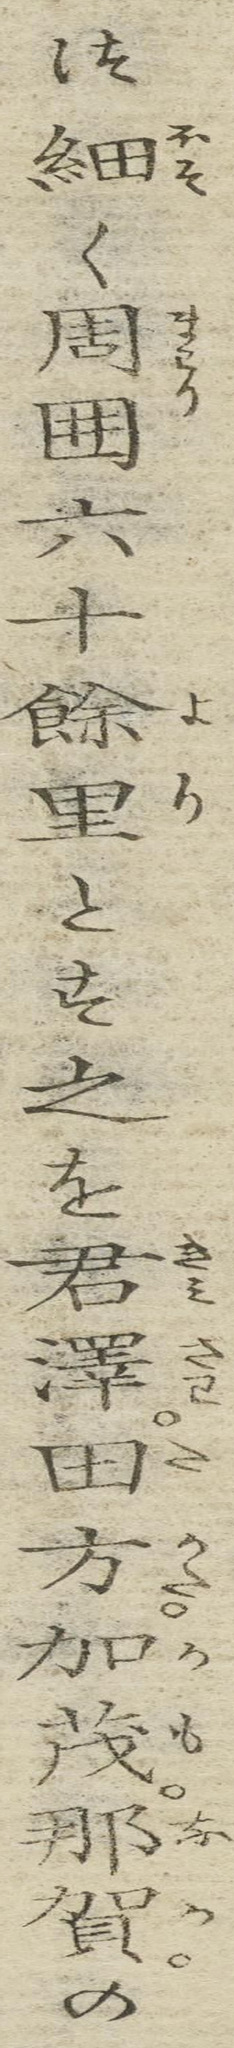つ細く周囲六十余里とす君沢多方加茂那賀の
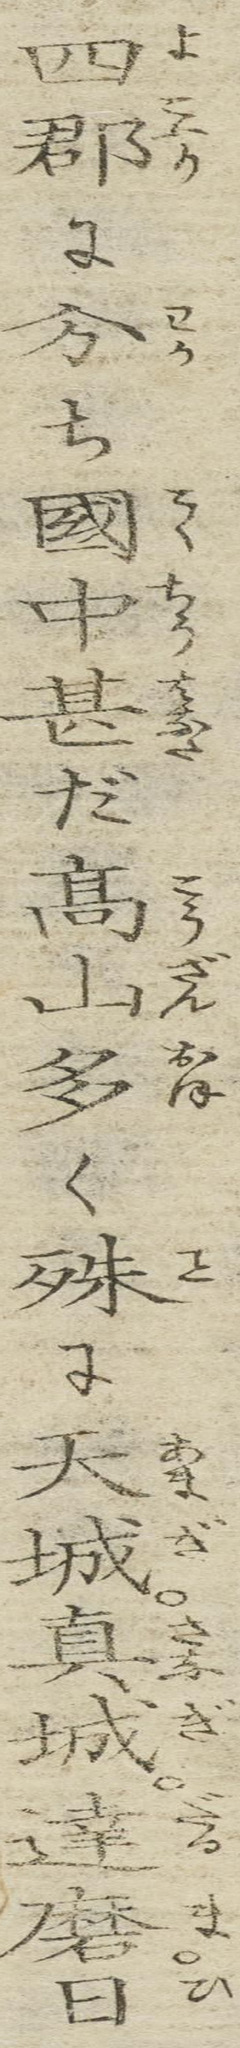四郡に分ち国中甚だ高山多く殊に天城真城達磨日
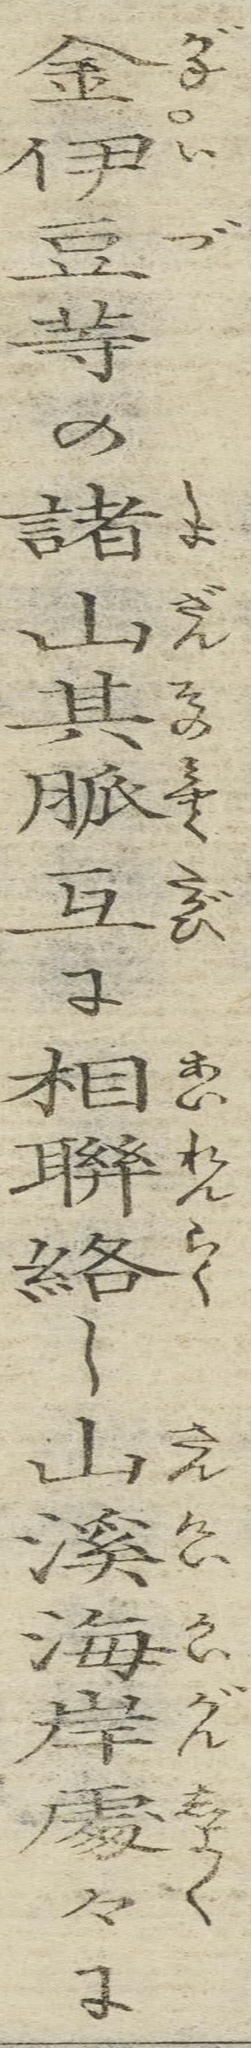金伊豆等の諸山其脈互に相聯絡し山渓海岸処々に
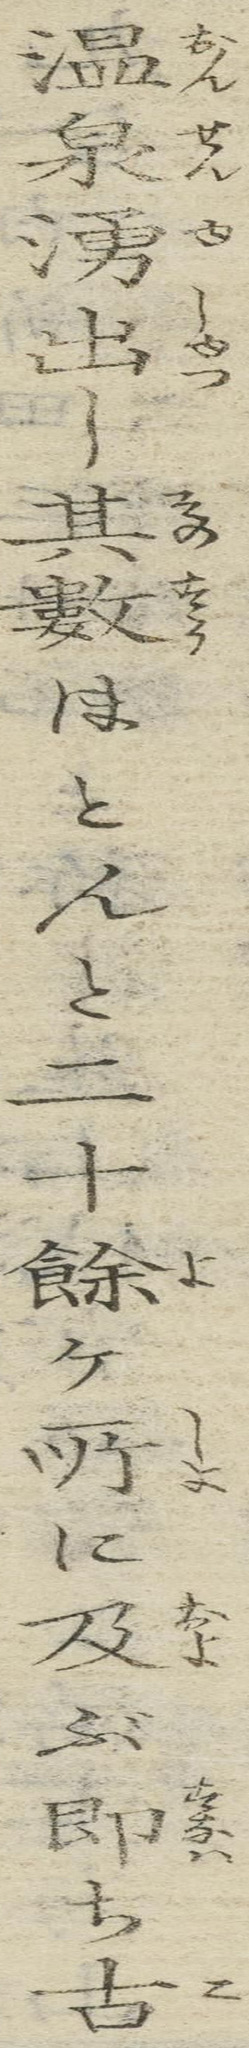温泉湧出し其数ほとんと二十余ヶ所に及ぶ即ち古
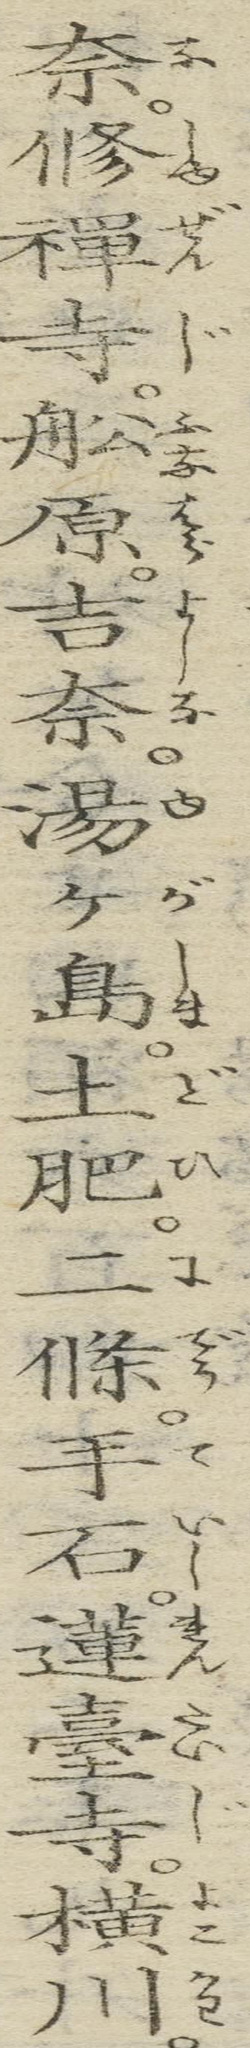奈修禅寺船原吉奈湯ヶ島土居二条手石蓮台寺横川
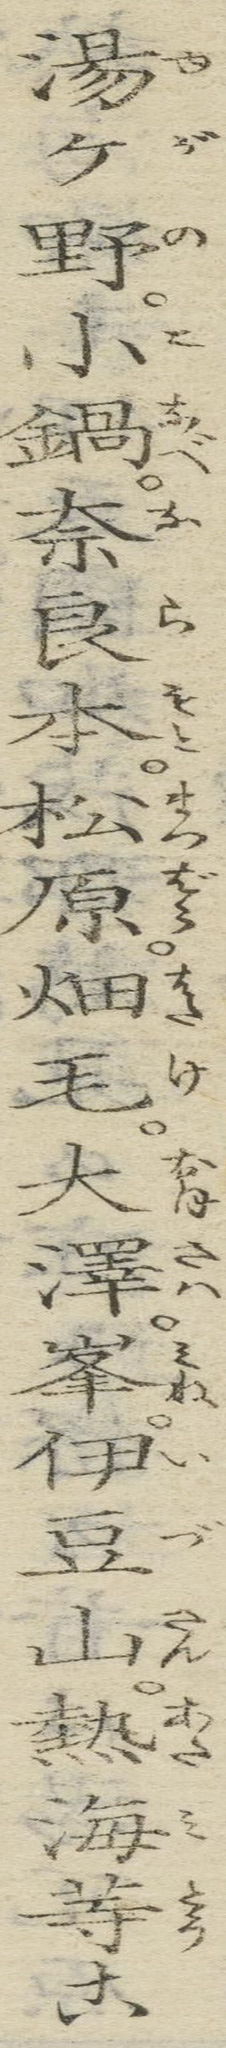湯ヶ野小鍋奈良本松原畑毛大沢峯伊豆山熱海等こ
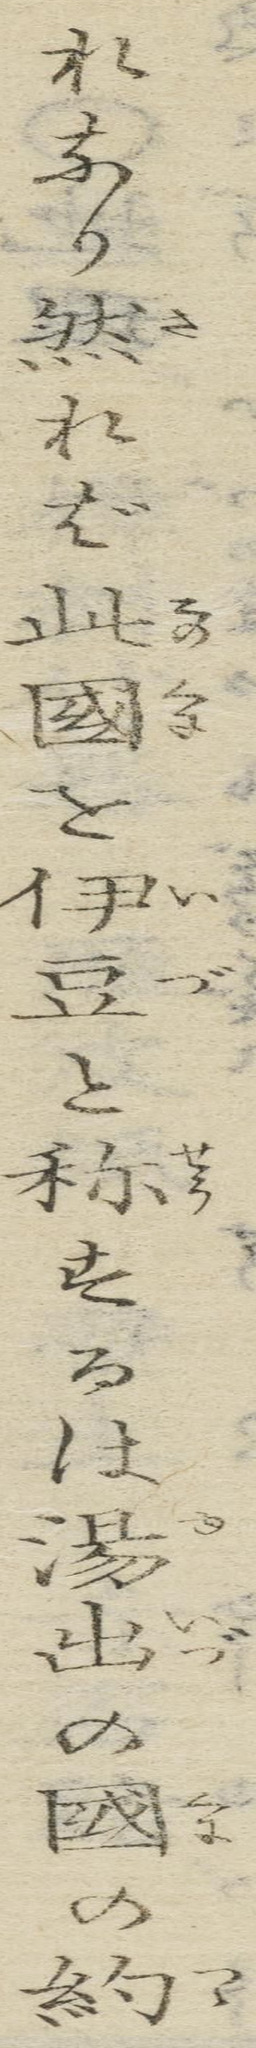れなり然れば此国を伊豆と称するは湯出の国の約
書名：豆州熱海誌　完
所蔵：東京大学地震研究所図書室 Earthquake Research Institute Library, The University of Tokyo, JAPAN
